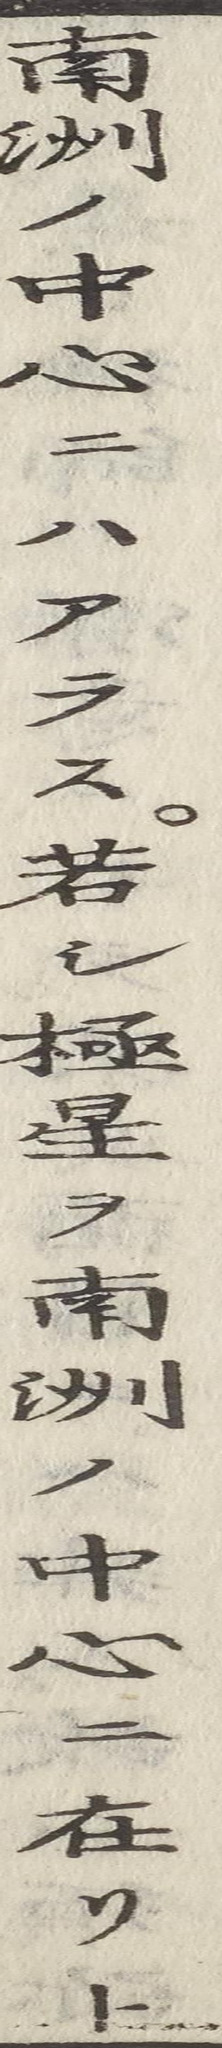南洲ノ中心ニハアラス。若シ極星ヲ南洲ノ中心ニ在リト
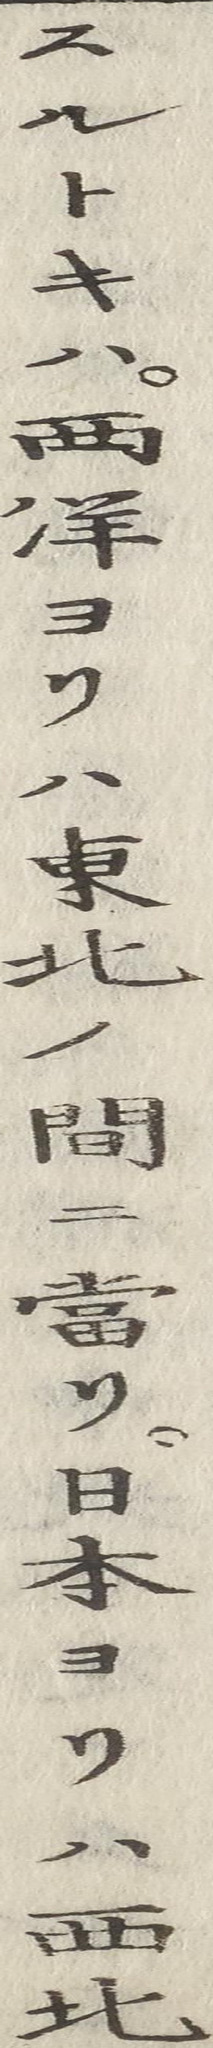スルトキハ。西洋ヨリハ東北ノ間ニ当リ。日本ヨリハ西北
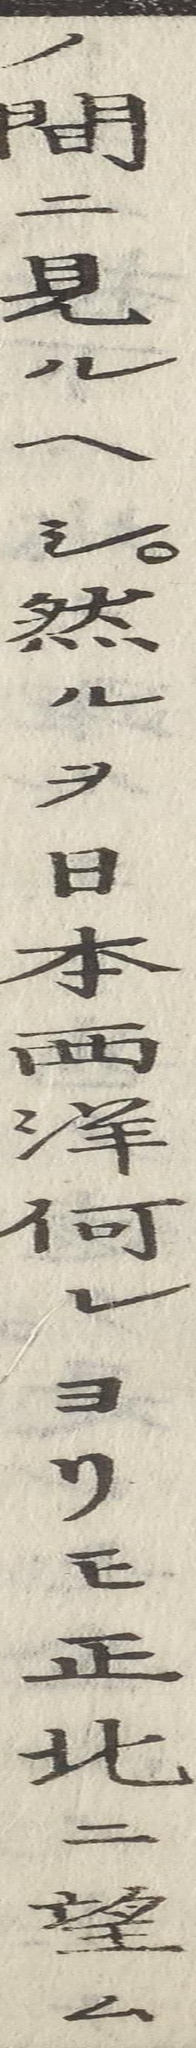ノ間ニ見ルヘシ。然ルヲ日本西洋何レヨリモ正北ニ望ム

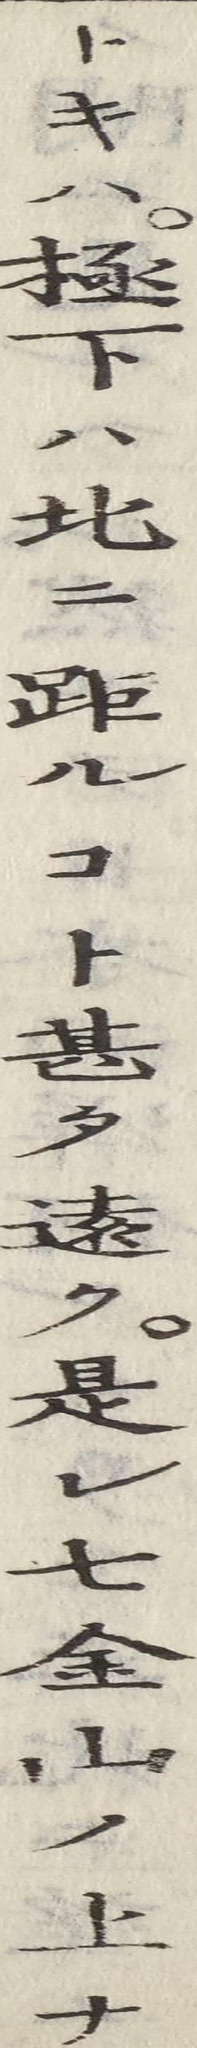トキハ。極下ハ北ニ距ルコト甚タ遠ク。是レ七金山ノ上ナ
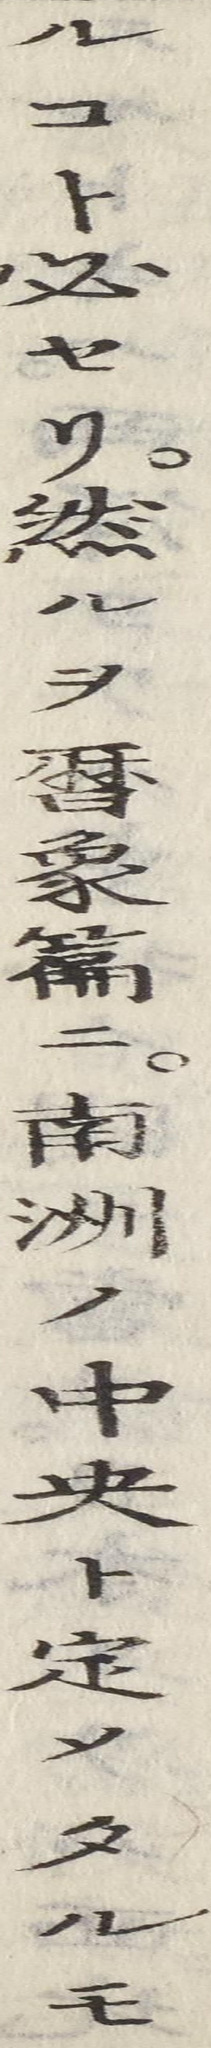ルコト必セリ。然ルヲ暦象篇ニ。南洲ノ中央ト定メタルモ
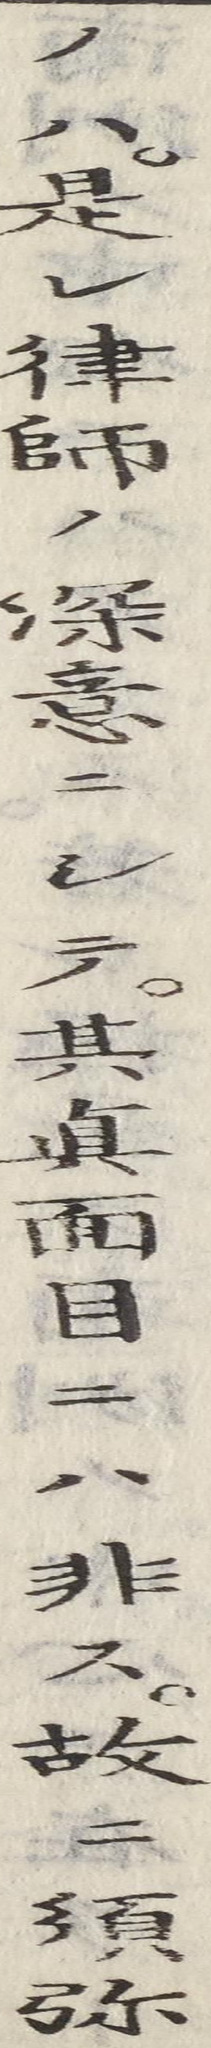ノハ。是レ律師ノ深意ニシテ。其真面目ニハ非ス。故ニ須弥
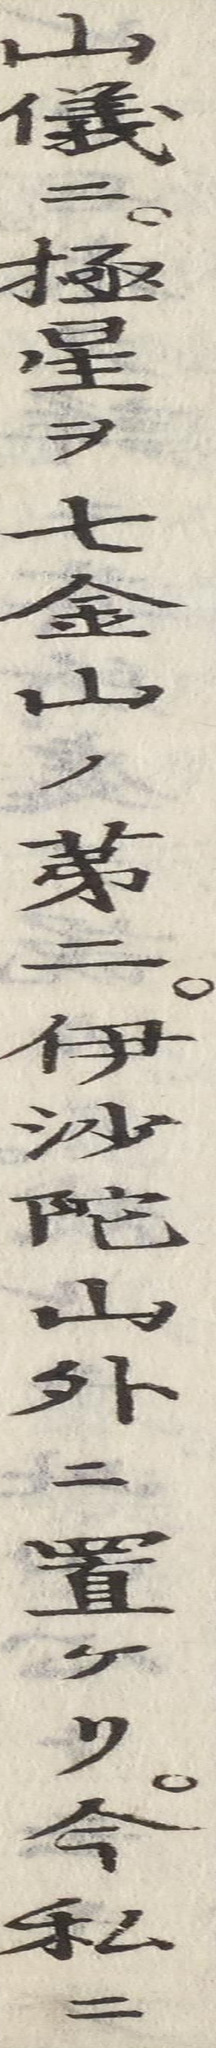山儀ニ。極星ヲ七金山ノ第二。伊沙陀山外ニ置ケリ。今私ニ
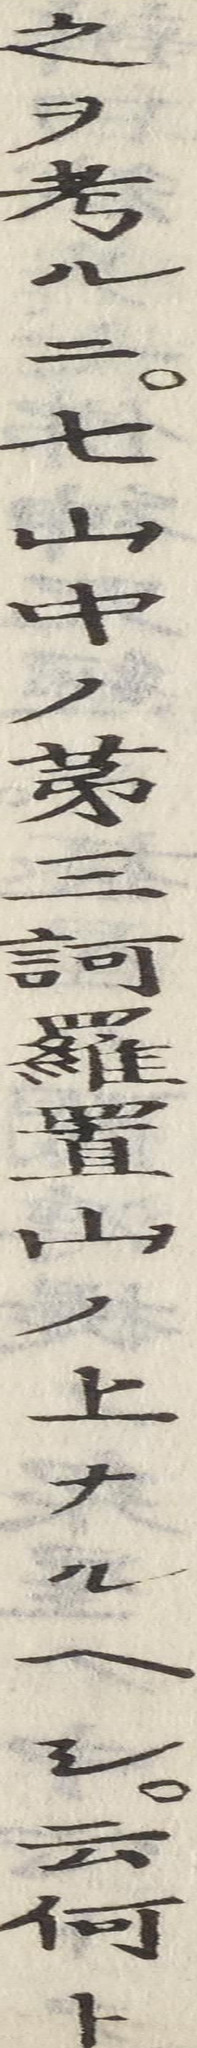之ヲ考ルニ。七山中ノ第三訶羅置山ノ上ナルヘシ。云何ト
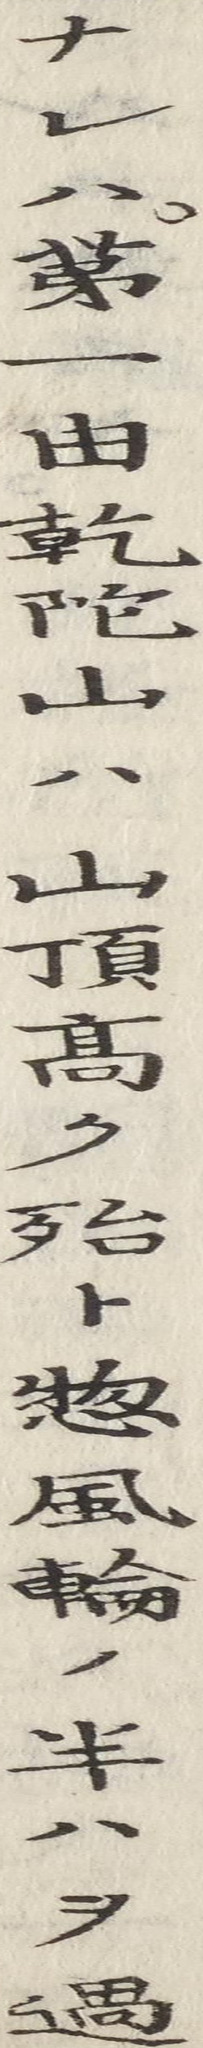ナレハ。第一由乾陀山ハ山頂高ク殆ト惣風輪ノ半ハヲ過
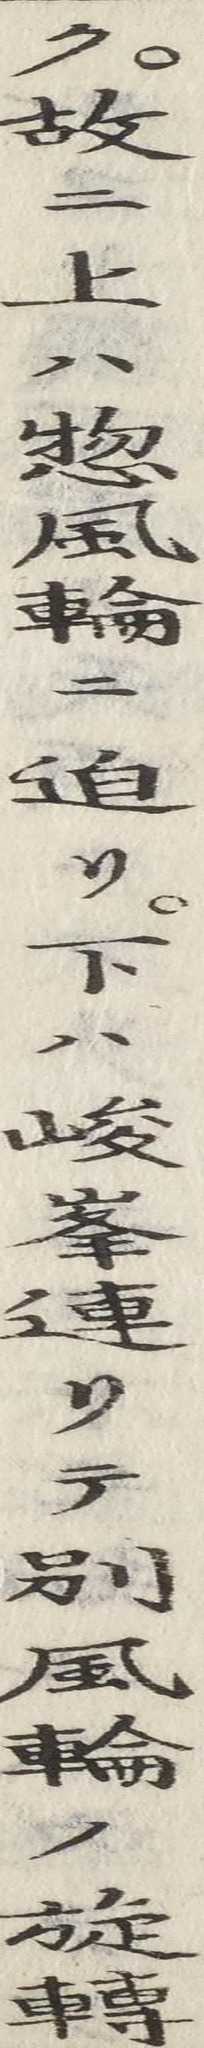ク。故ニ上ハ惣風輪ニ迫リ。下ハ峻峯連リテ別風輪ノ旋転
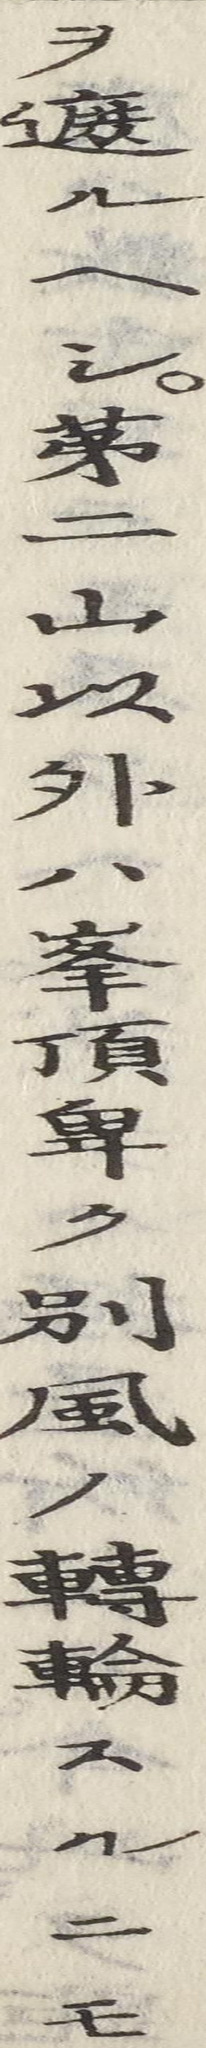ヲ遮ルヘシ。第二山以外ハ峯頂卑ク別風ノ転輪スルニモ
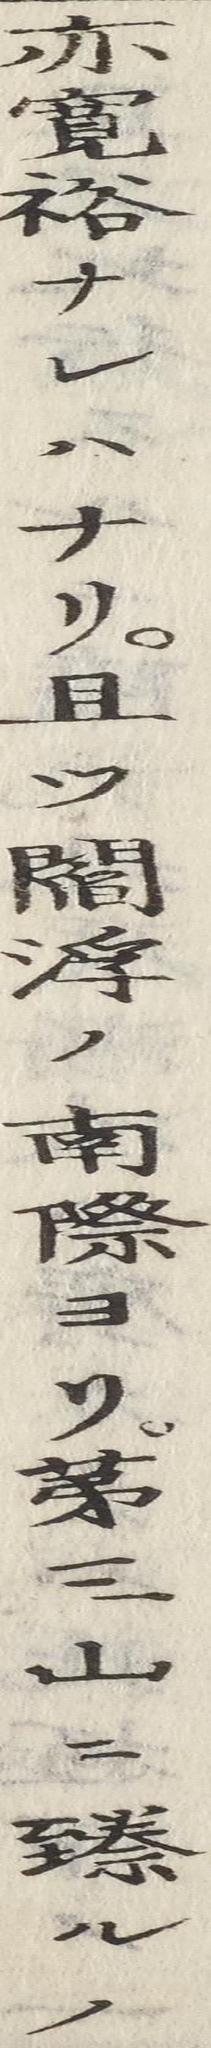亦寛裕ナレハナリ。且ツ閻浮ノ南際ヨリ。第三山ニ臻ルノ
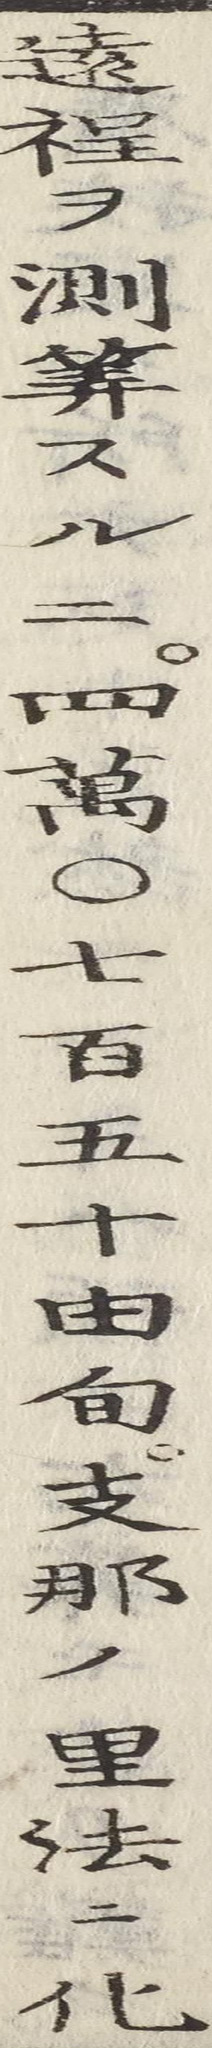遠程ヲ測筭スルニ。四万〇七百五十由旬。支那ノ里法ニ化
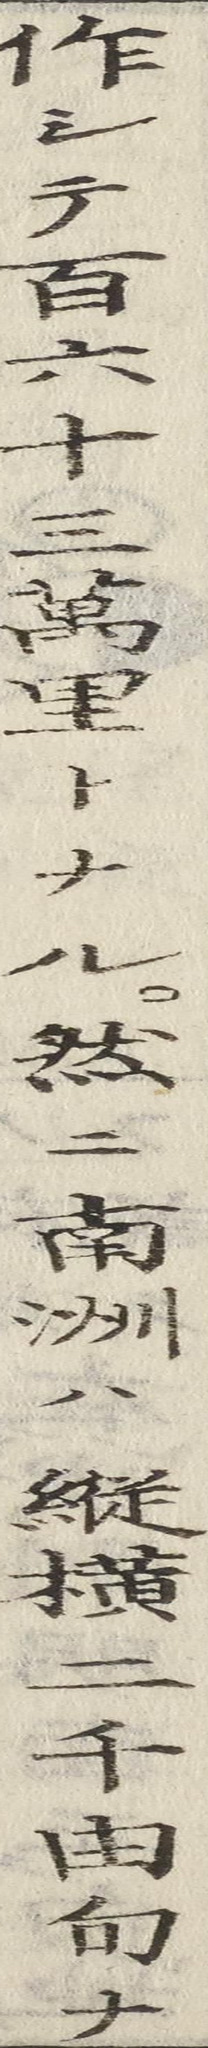作シテ百六十三万里トナル。然ニ南洲ハ縦横二千由旬ナ
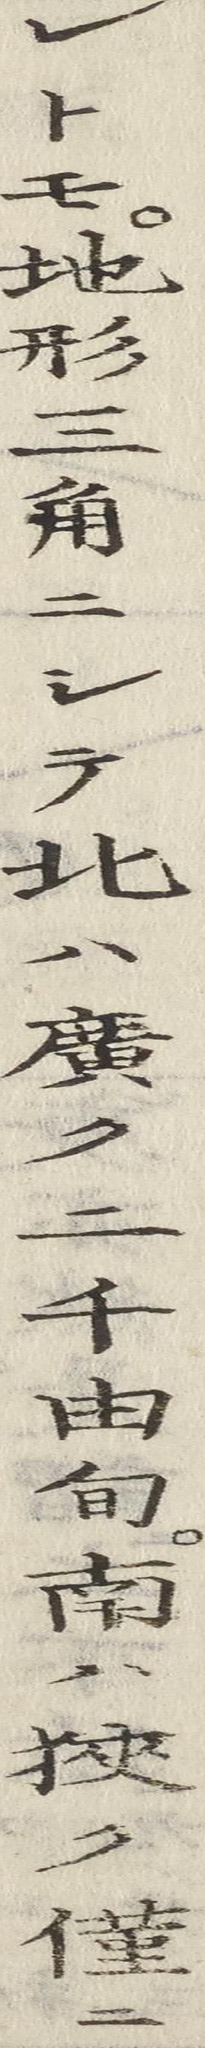レトモ。地形三角ニシテ北ハ広ク二千由旬。南ハ狭ク僅ニ
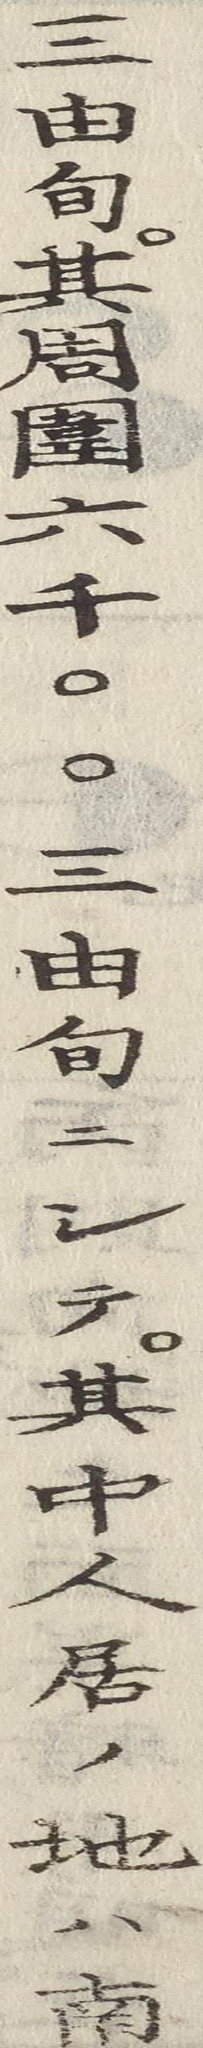三由旬。其周囲六千〇〇三由旬ニシテ。其中人居ノ地ハ南
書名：護法新論　二編　中
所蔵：東京大学地震研究所図書室 Earthquake Research Institute Library, The University of Tokyo, JAPAN
